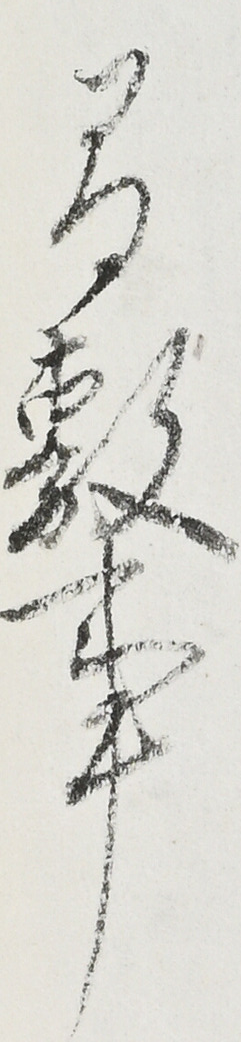間敷事
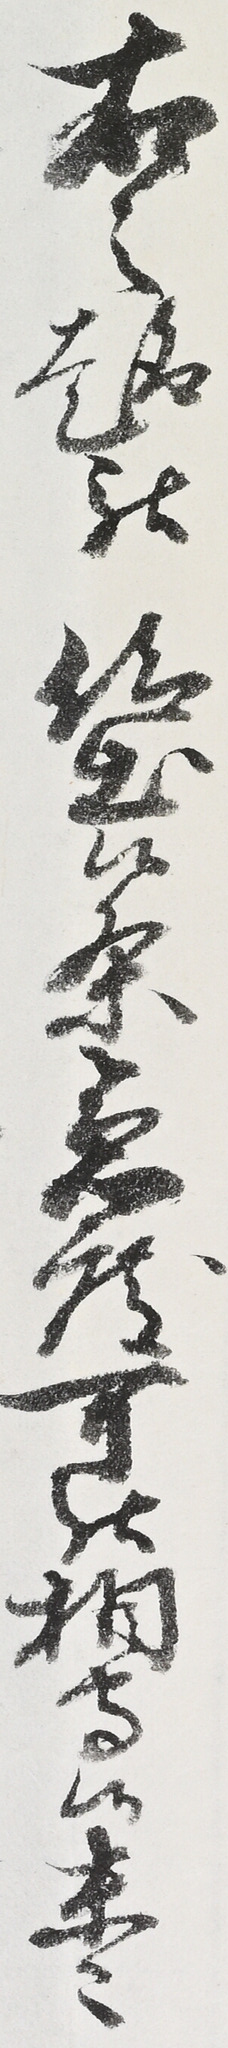右之趣被仰出候条急度可被相守候末々
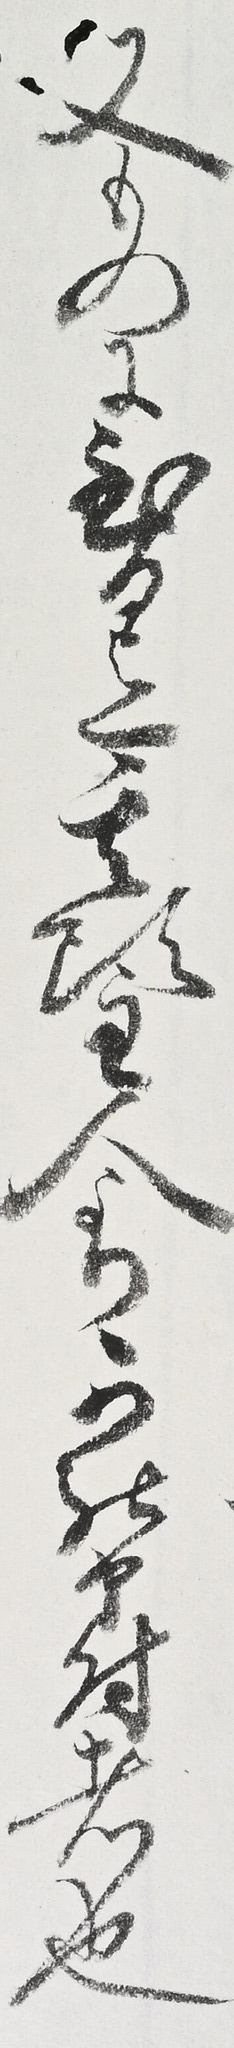又ものに至る迄其頭主人より可被申付者也
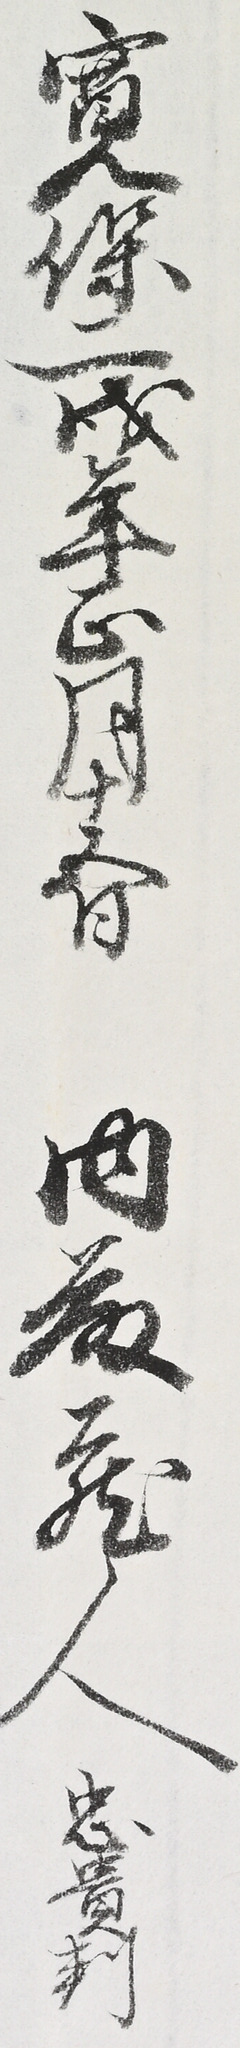寛保二戌年正月十五日内藤蔵人忠貴判

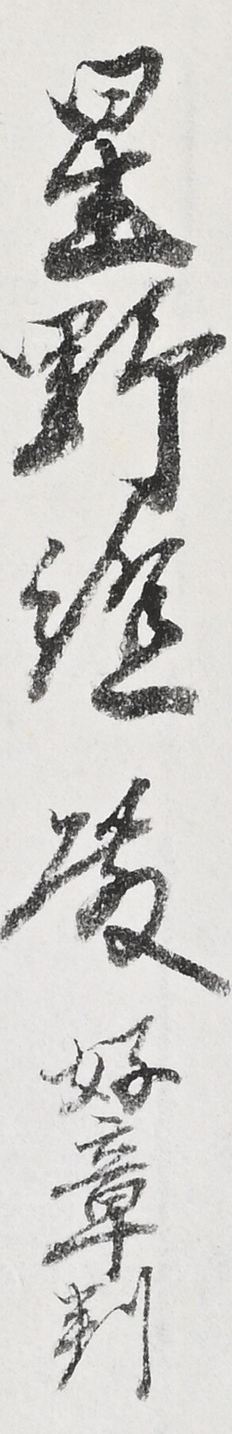星野縫殿好章判
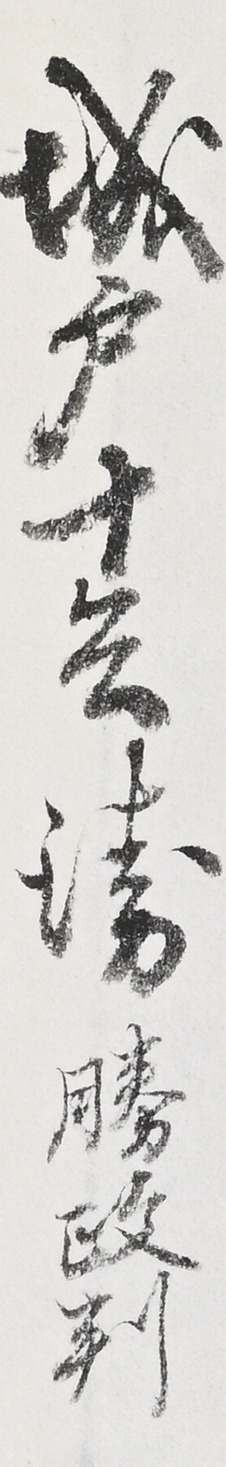城戸十兵衛勝政判
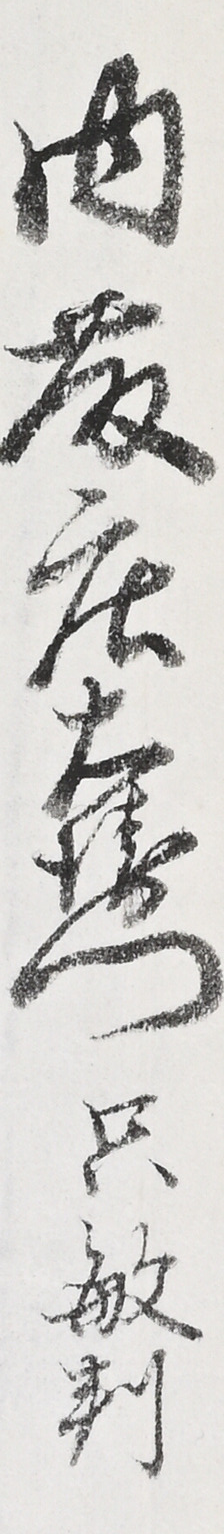内藤庄右衛門只敏判
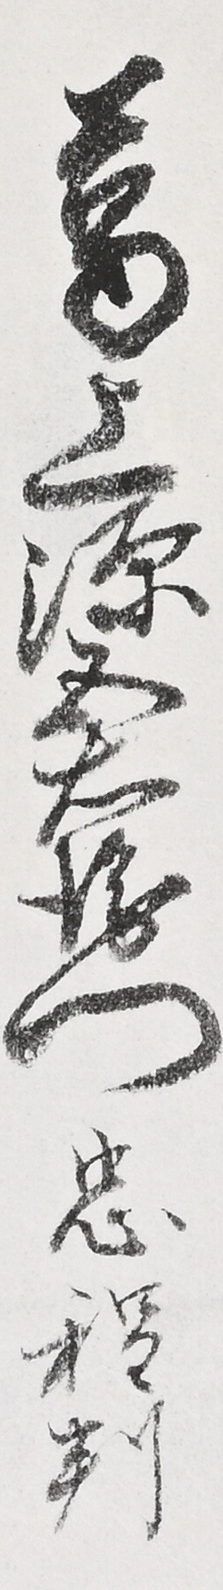葛上源五右衛門忠程判
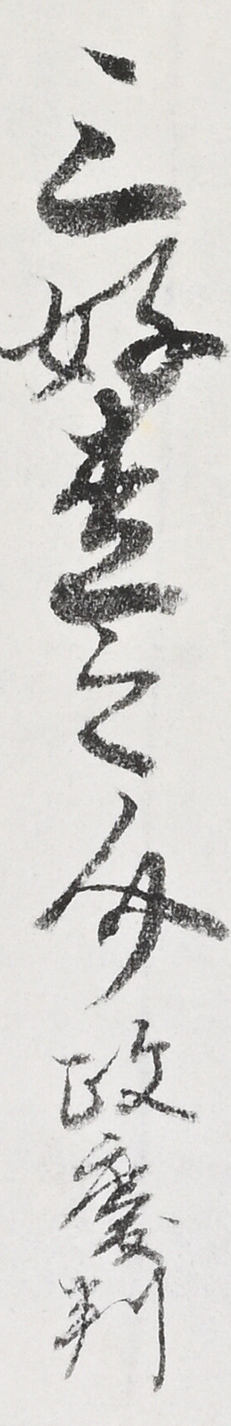三好達之介政慶判

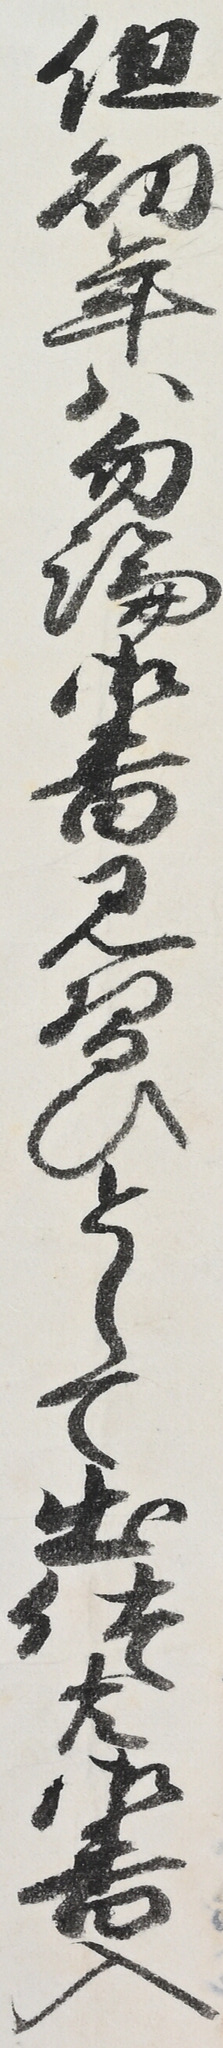但幼年者勿論御番見習ひとして出仕候共御番入
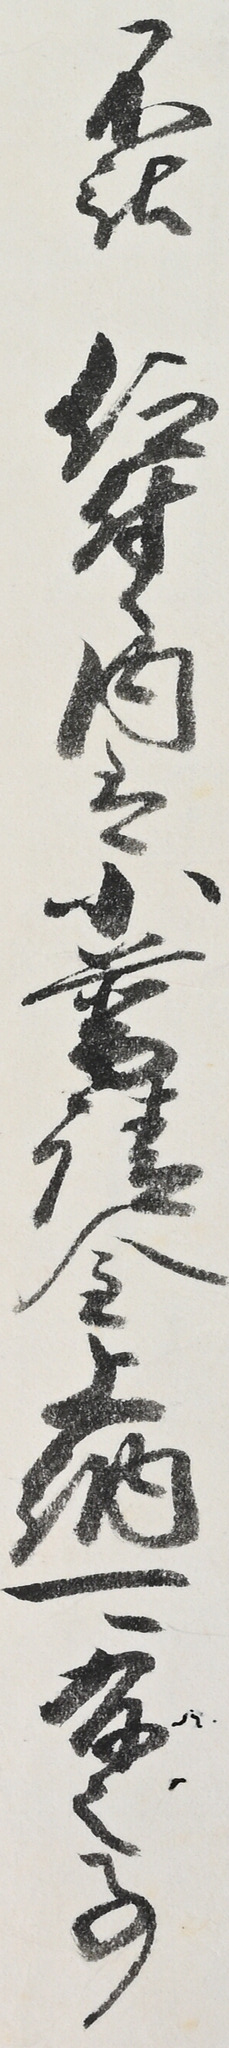不被仰付候内は小普請金上納可有之事
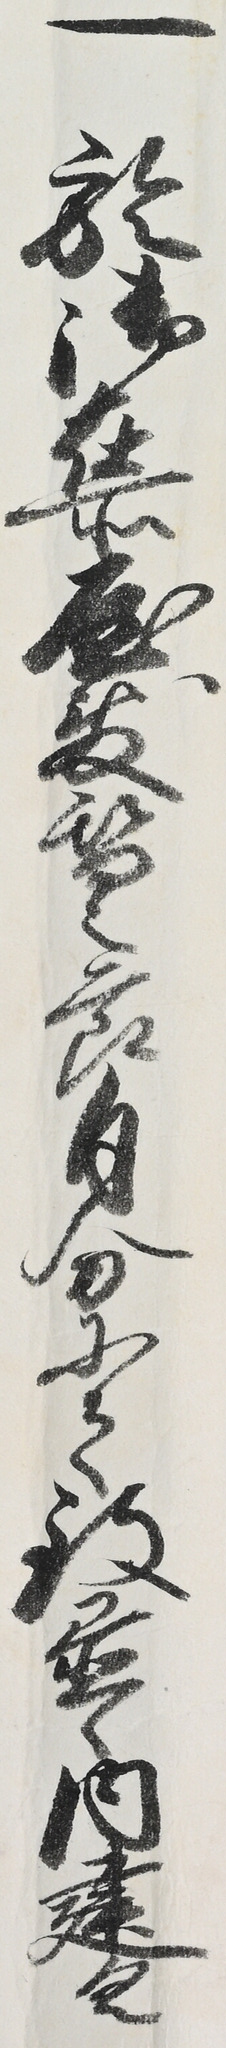一於御在所屋敷替之節自分にて致置候内建具
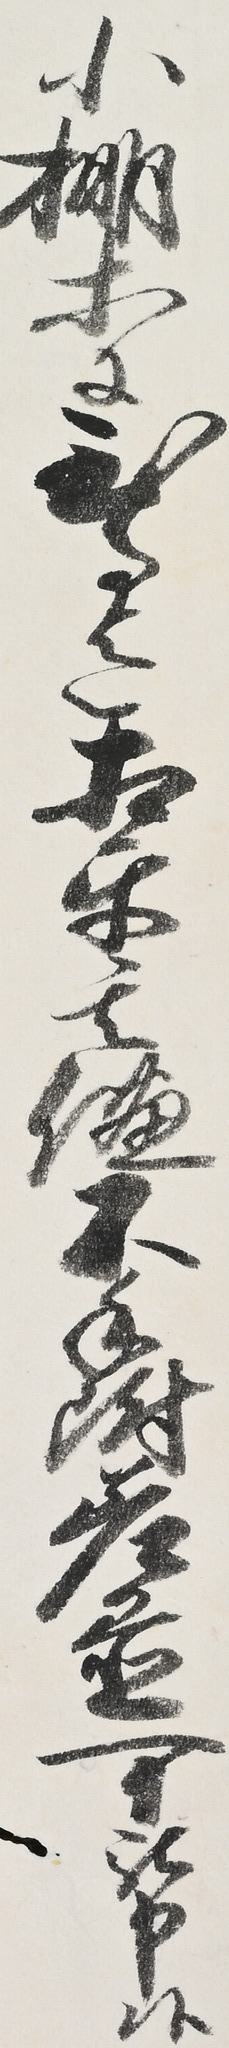小棚等に至る迄相互其侭不手附差置可被申候
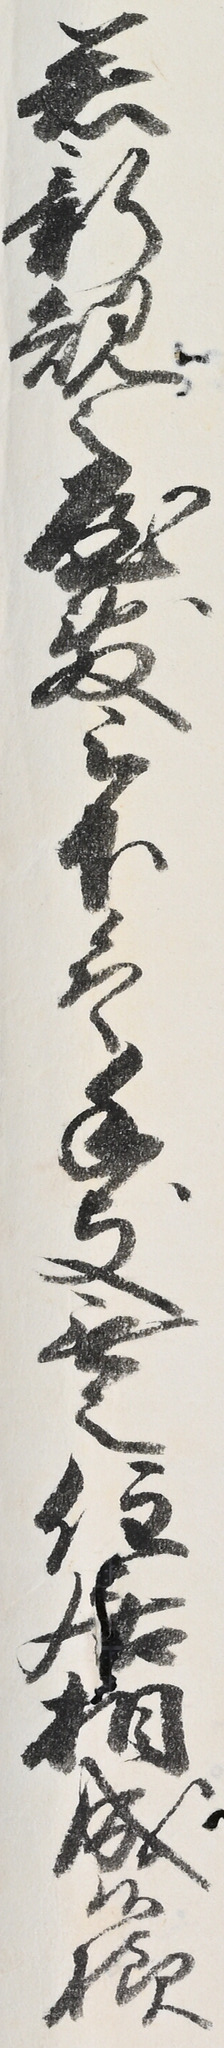若新規之屋敷被下候ハゝ手支無之住居相成候様
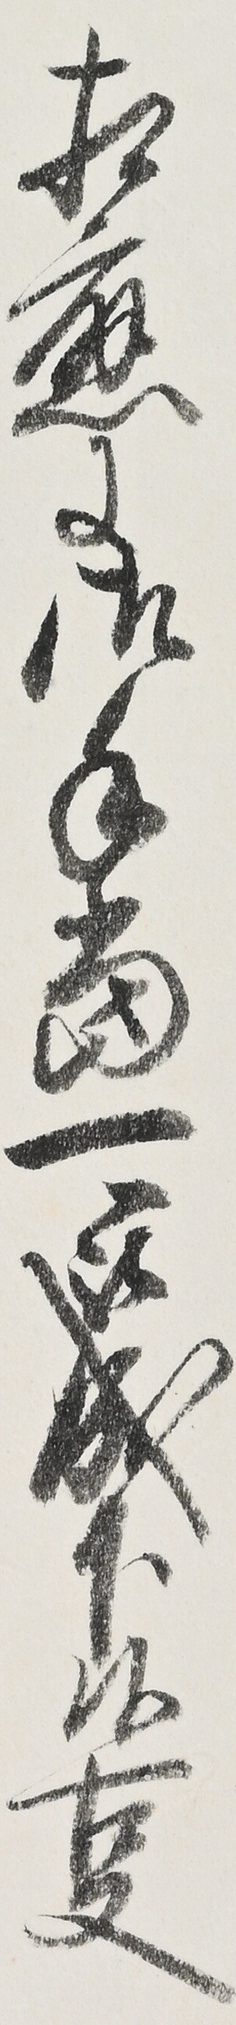相応に御手当可被成下候事
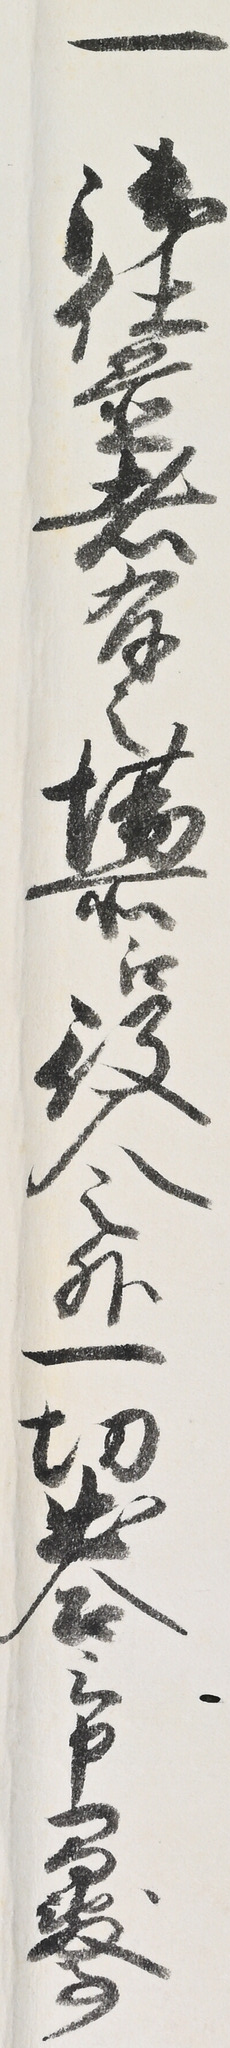一御仕置者有之場所江役人之外一切出合被申間敷事
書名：仰書覚〔写共二通一括〕
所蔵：伊那市立高遠町図書館・合同会社AMANE
